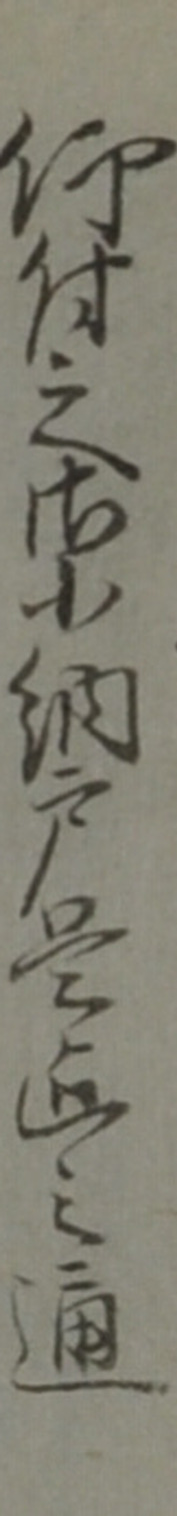仰付之御小納戸是迄之通
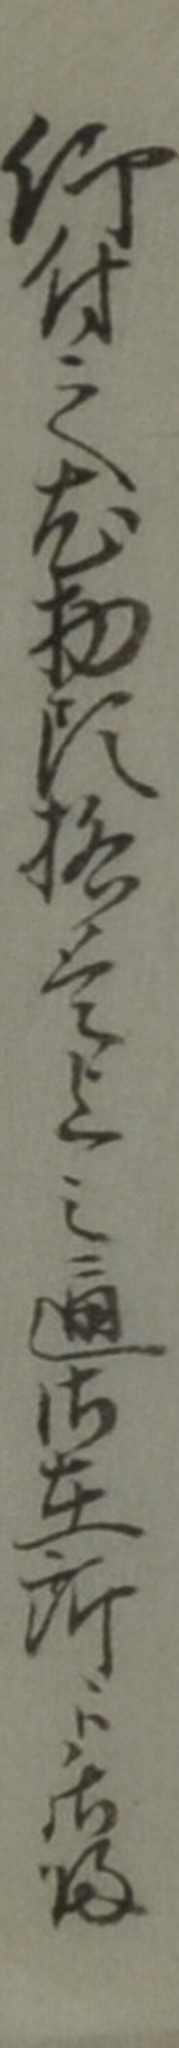仰付之尤物頭格是迄之通御在所江御帰
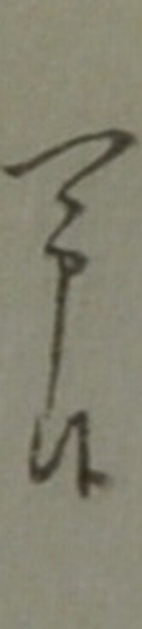可申候
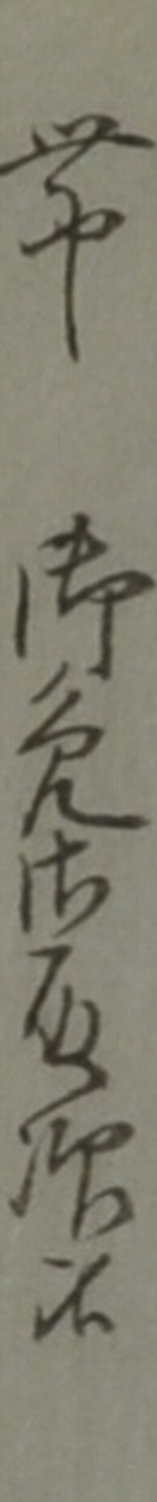帯御免御取次被
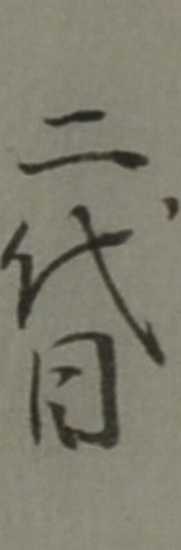二代目
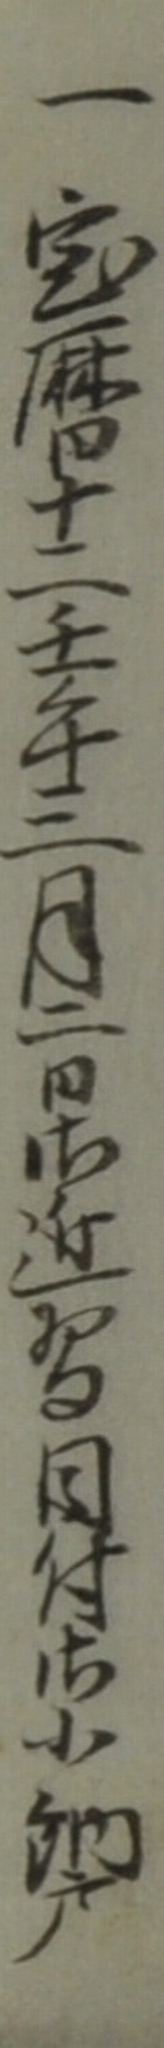一宝暦十二壬午三月二日御近習目付御小納戸
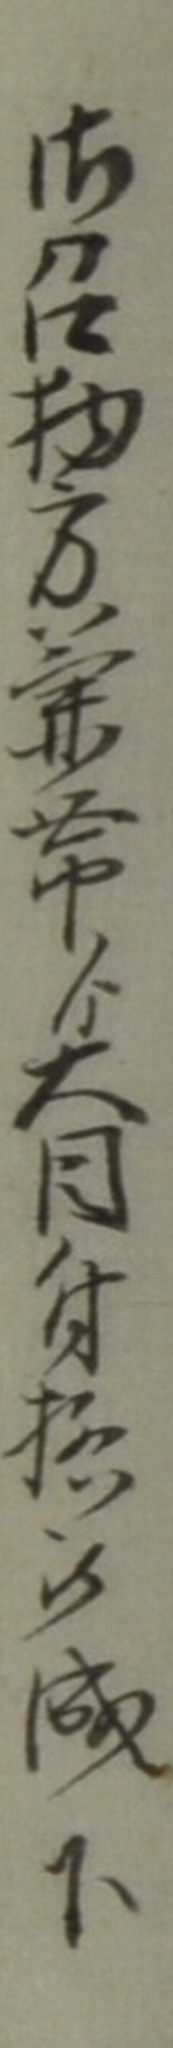御召物方兼帯ゟ大目付格被成下
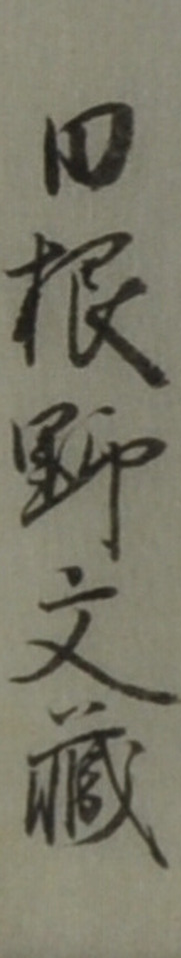日根野文蔵

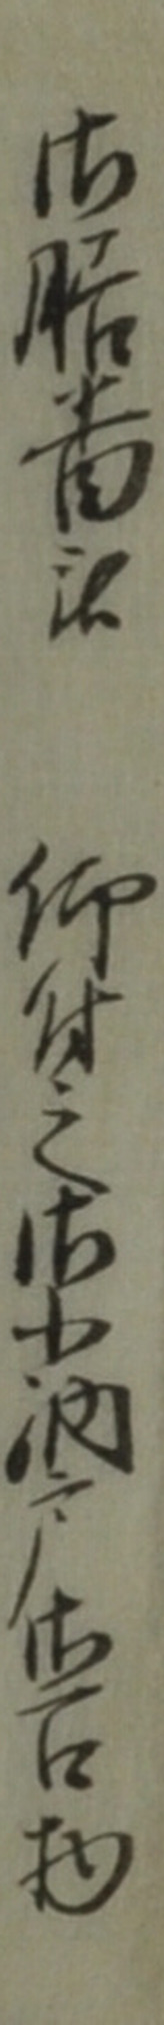御膳番被仰付之御小納戸御召物
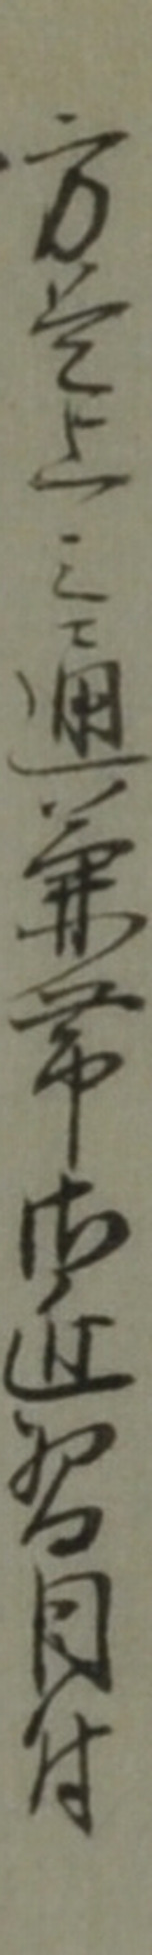方是迄之通兼帯御近習目付
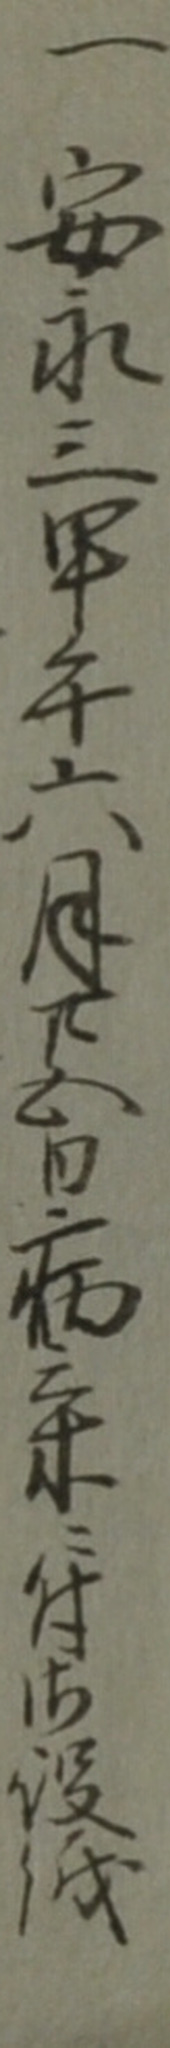一安永三甲午六月廿五日病気ニ付御役儀
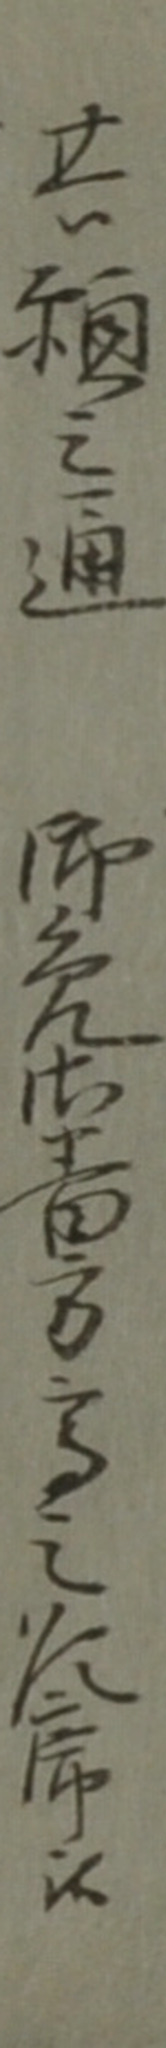共願之通御免御番方高之順席被
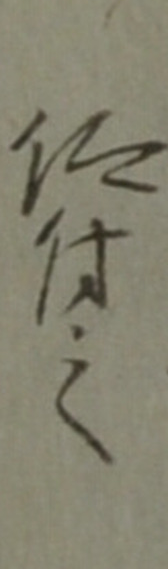仰付之
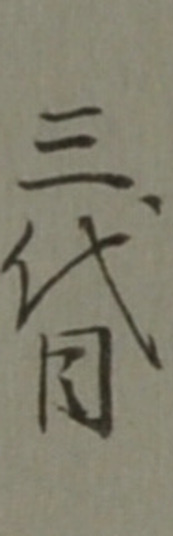三代目
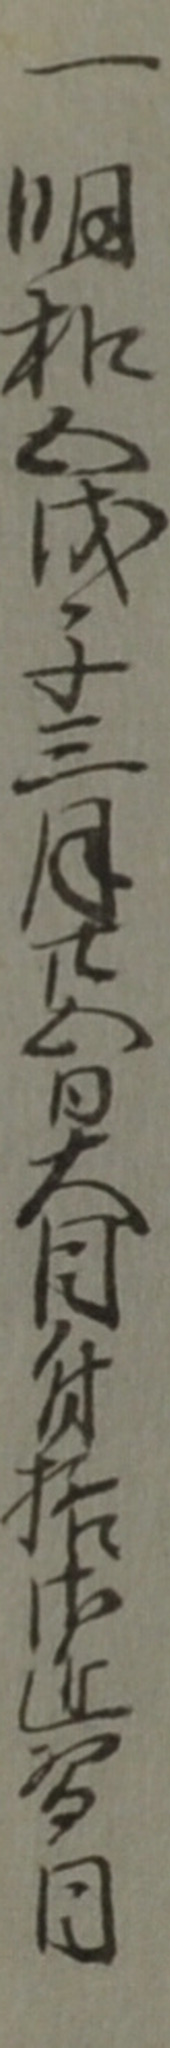一明和五戊子三月廿五日大目付格御近習目
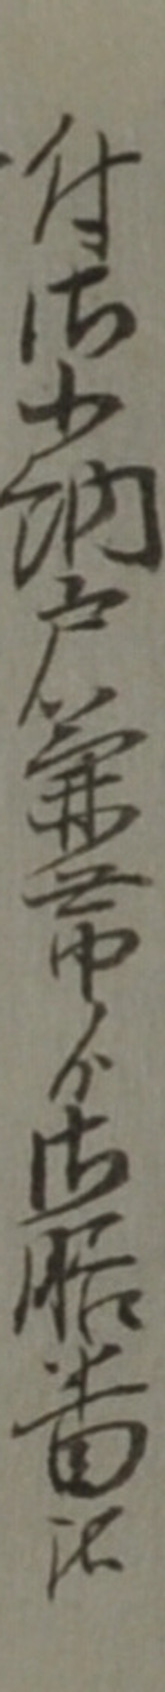付御小納戸兼帯ゟ御膳番被
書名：諸御役代々録（四）
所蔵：伊那市立高遠町図書館・合同会社AMANE
